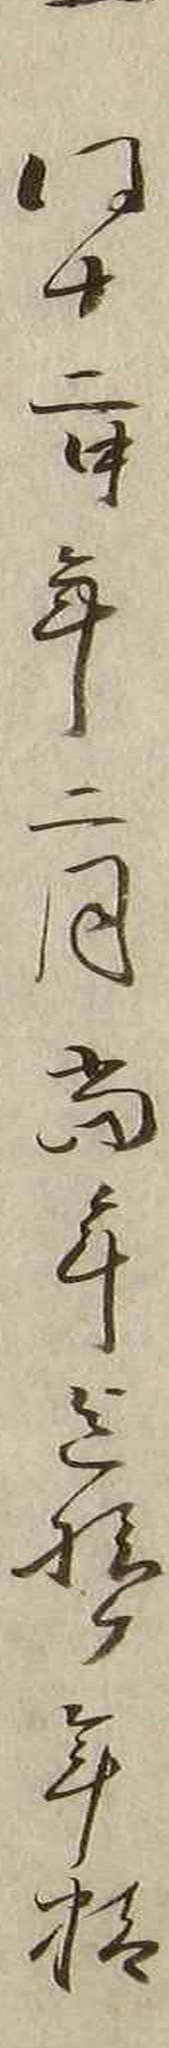一同十二申年二月当年迄拾ケ年精
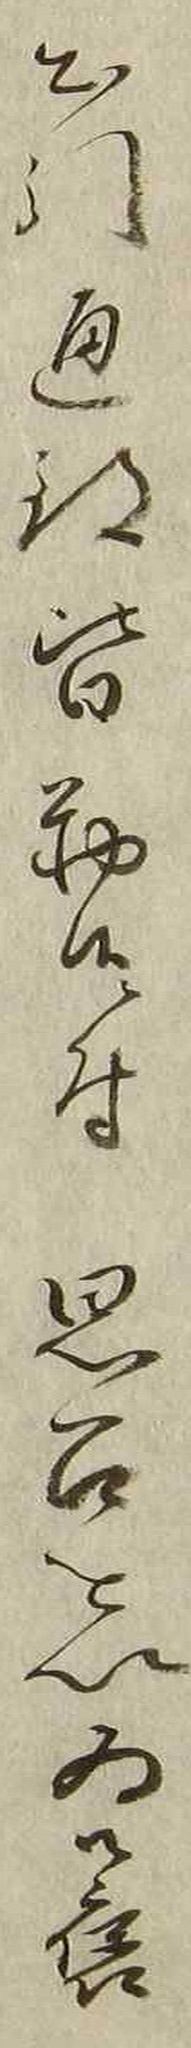出引通致皆勤候ニ付思召を以為御褒
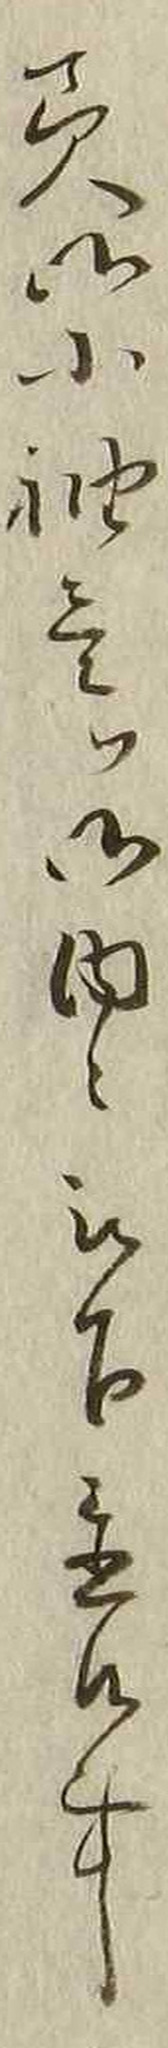美御小袖壱ツ御内々被下置候事
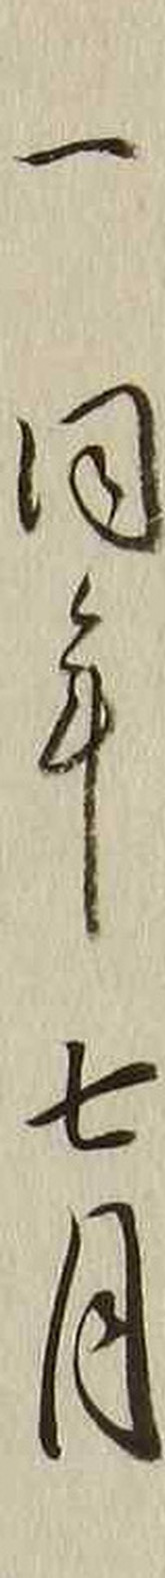一同年七月
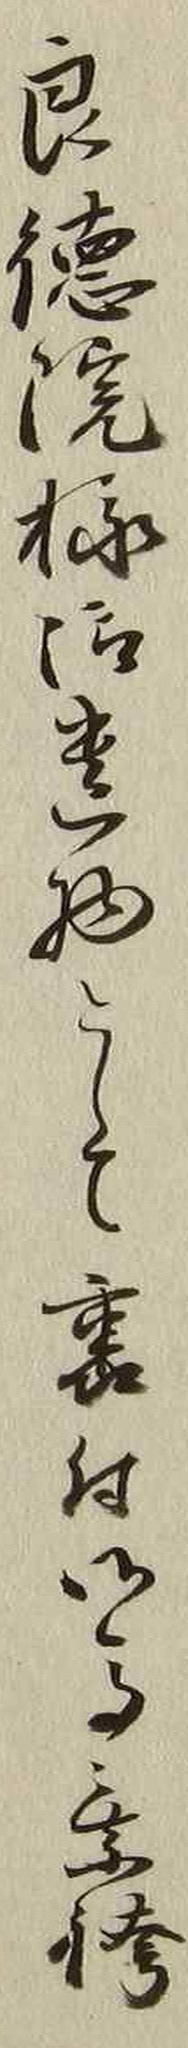良徳院様御遺物として裏付御馬乗袴
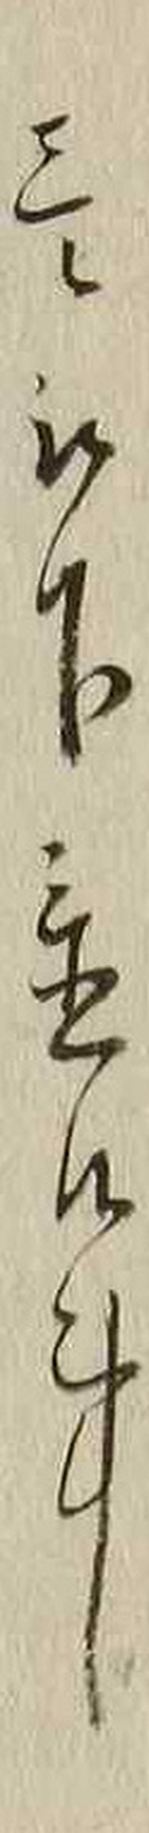壱被下置候事
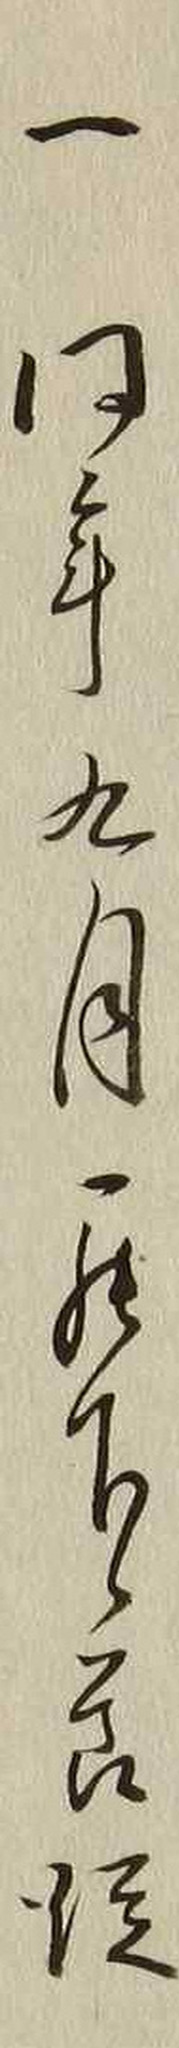一同年九月罷下候節従
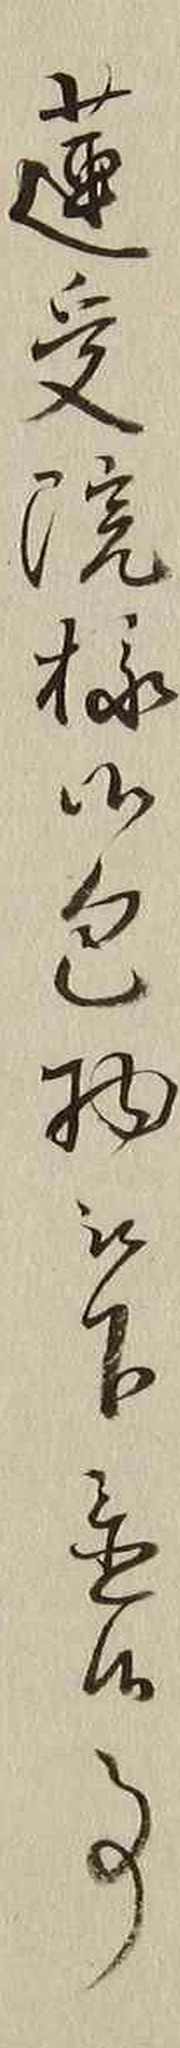蓮受院様御包物被下置候事
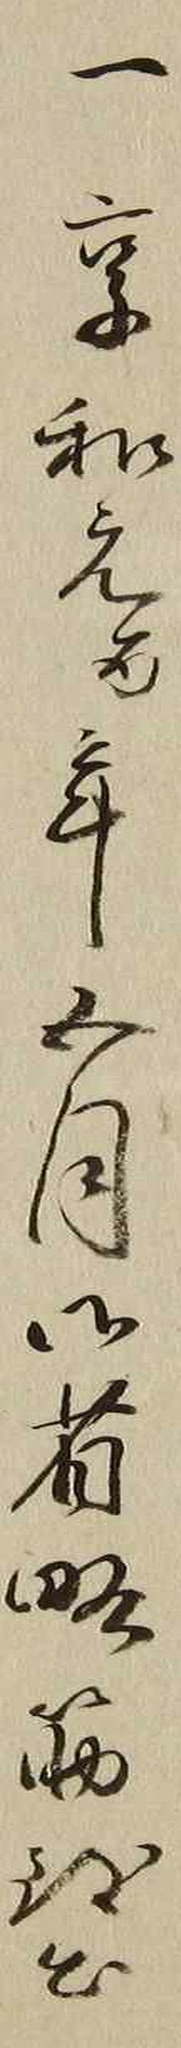一享和元酉年五月御省略筋致出
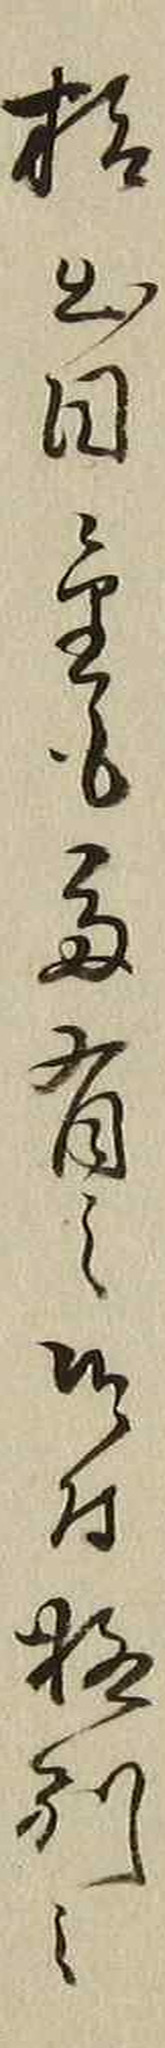精出目金も多有之候ニ付格別之
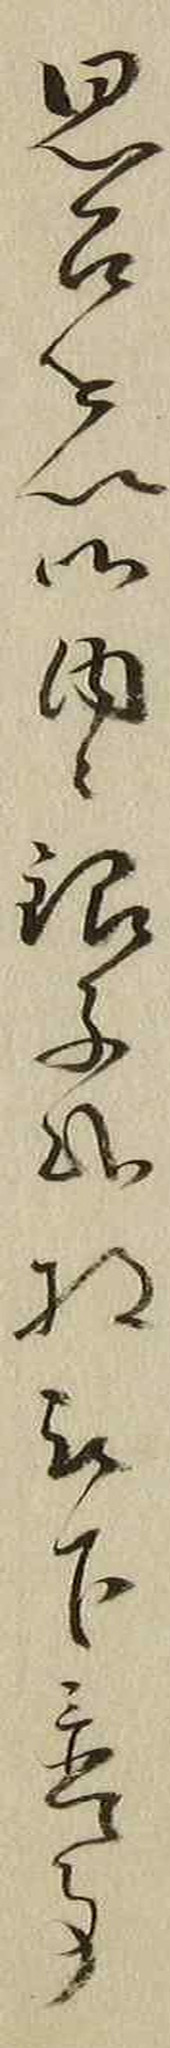思召を以御内々銀子弐枚被下置候事
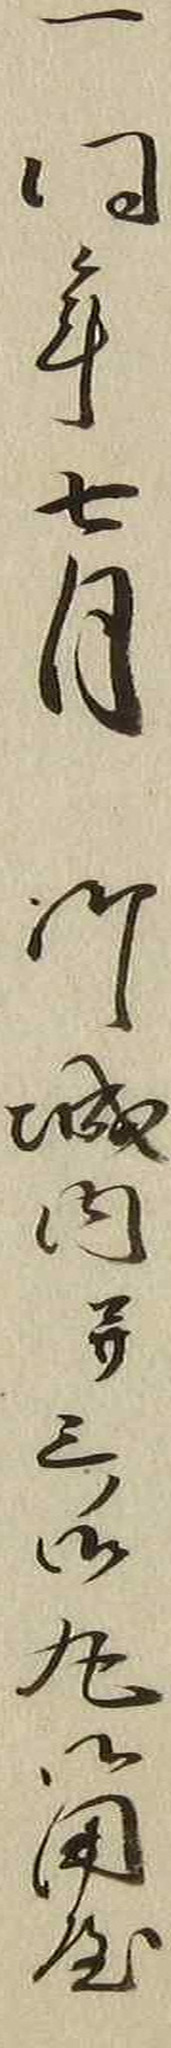一同年七月御竹城内并三ノ御丸御用屋
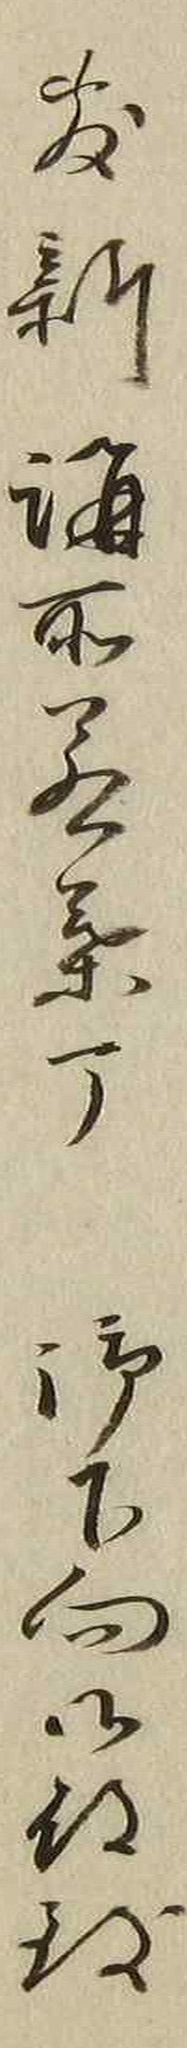敷新講所若葉丁御下向御役致
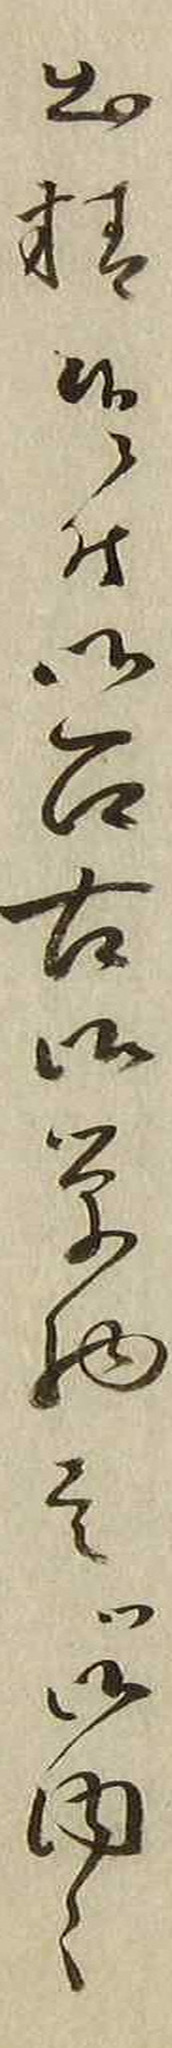出精候ニ付御召古御単物壱ツ御内々
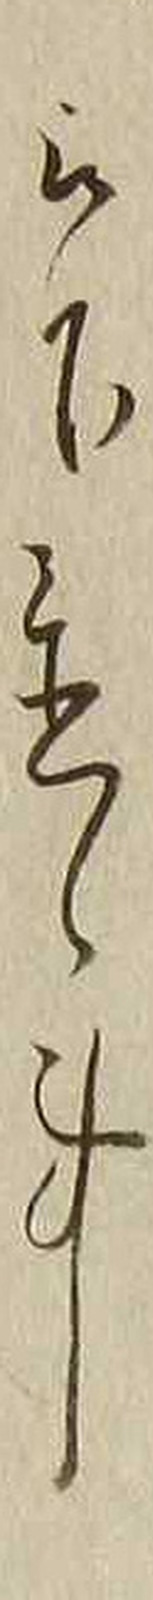被下置候事
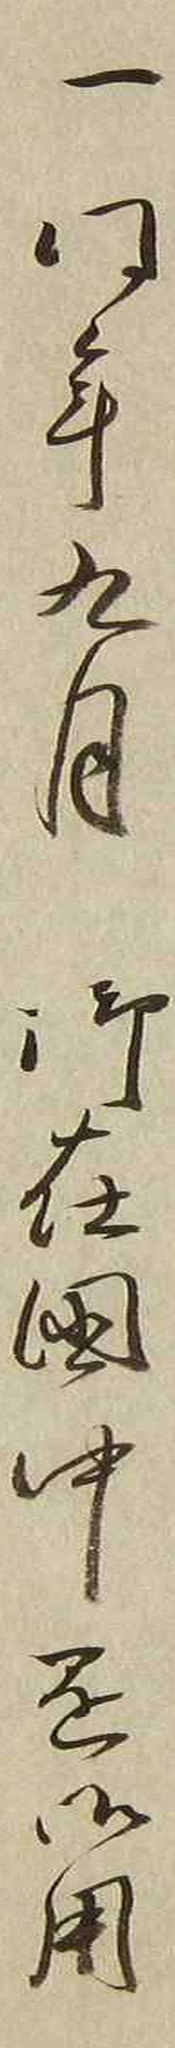一同年九月御在国中懸御用
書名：諸士系譜　巻之25　い之部25
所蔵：会津若松市立会津図書館
